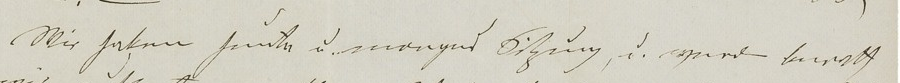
Wir haben heute u. morgens Sitzung, u. werden berathen,
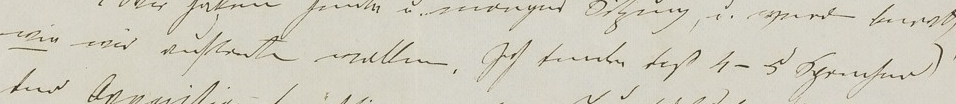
wie wir auftreten wollen. Ich denke daß 4–5 Sprecher
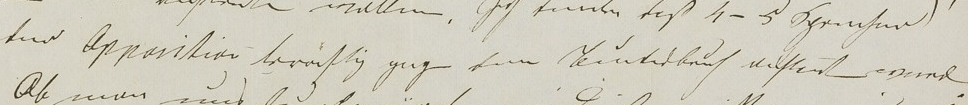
der Opposition kräftig gegen den Bundesbruch auftreten werden.
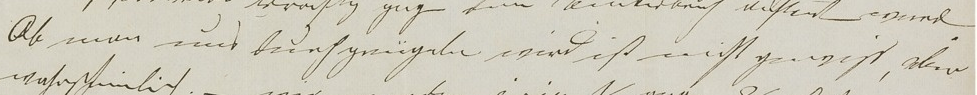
Ob man uns durchprügeln wird ist nicht gewiss, aber
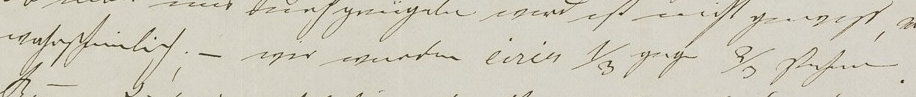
wahrscheinlich; – wir werden circa ⅓ gegen ⅔ stehen.
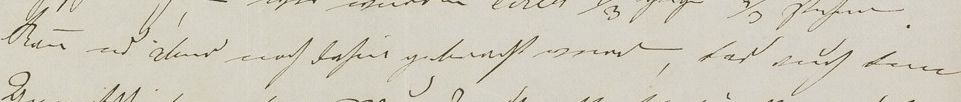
Kann es aber noch dahin gebracht werden, das auch den
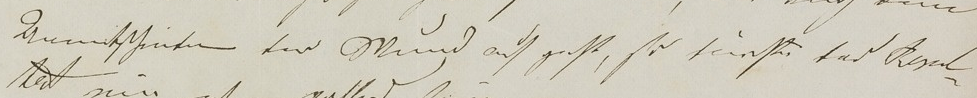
Unentschiedenen der Mund aufgeht, so dürfte das Resul-
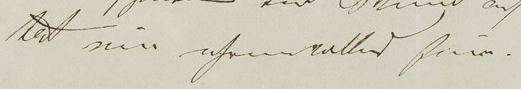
tat e in ehrenvolles sein. –
